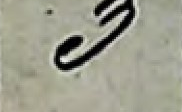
3
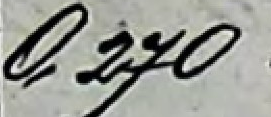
0,270
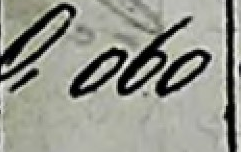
0,060
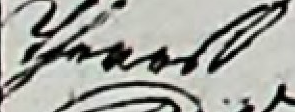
Theres
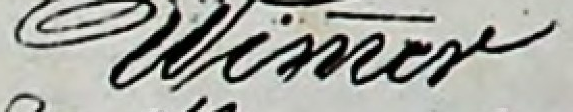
Wimmer
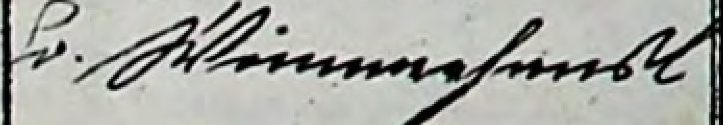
v. Wimmerhensl
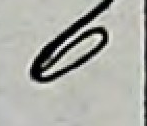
6
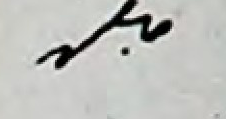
do
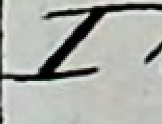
I
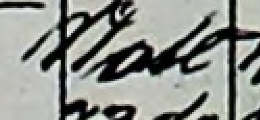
Statl
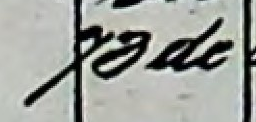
78 de
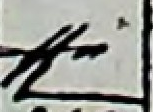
Hn
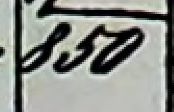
850
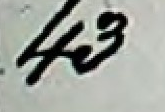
43
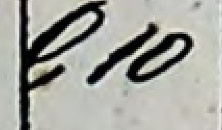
0,10
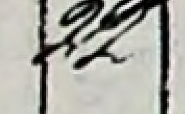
22
